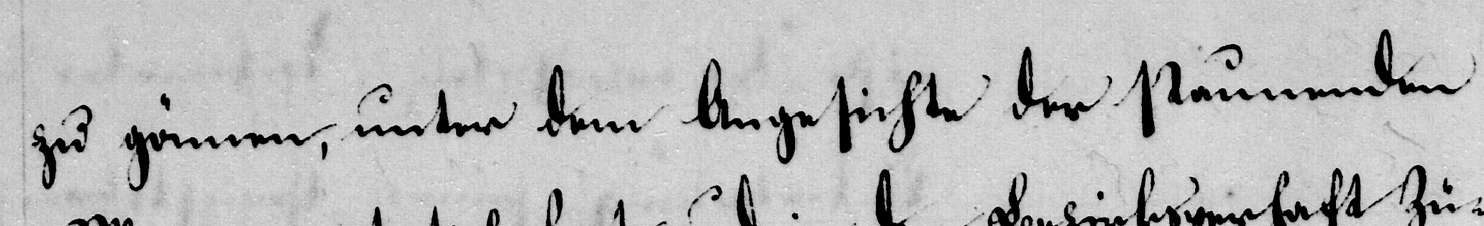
zu gönnen, unter dem Angesichte der staunenden
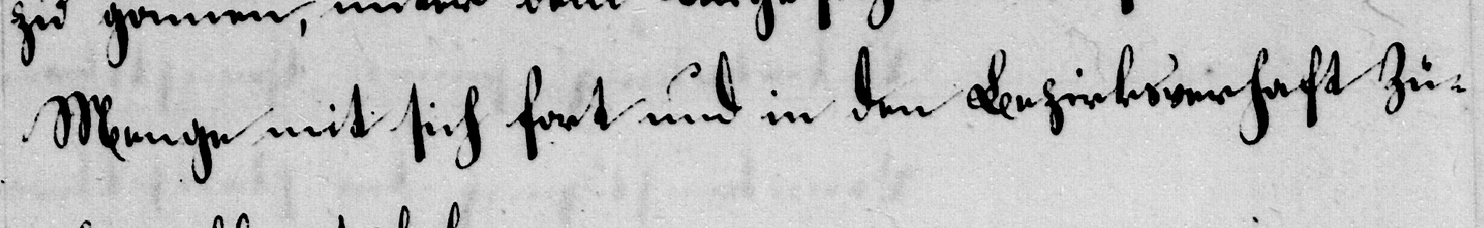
Menge mit sich fort und in den Bezirksverhaft Zü¬
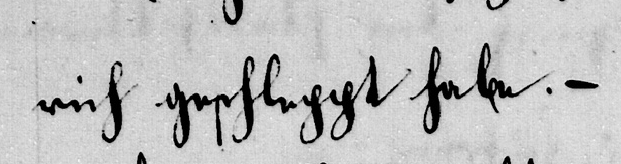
rich geschleppt habe. –
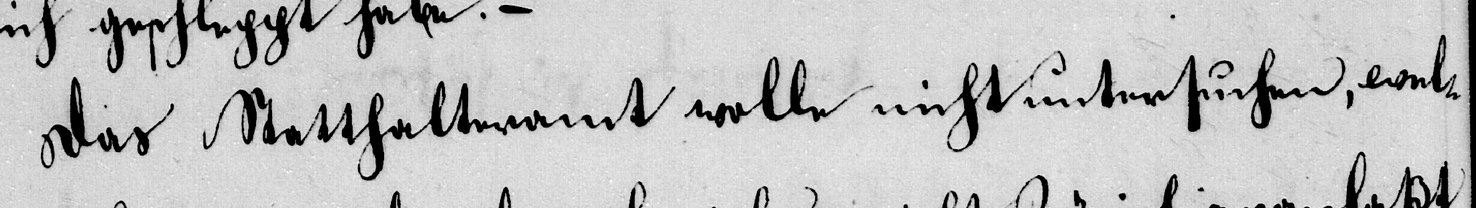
Das Statthalteramt wolle nicht untersuchen, wel¬
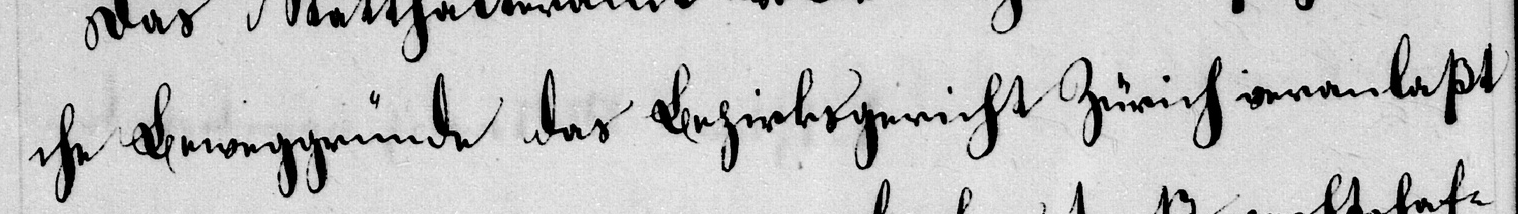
che Beweggründe das Bezirksgericht Zürich veranlaßt
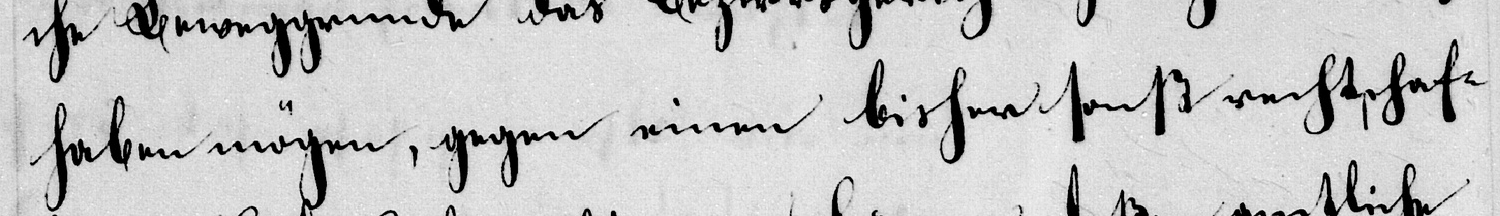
haben mögen, gegen einen bisher sonst rechtschaf¬
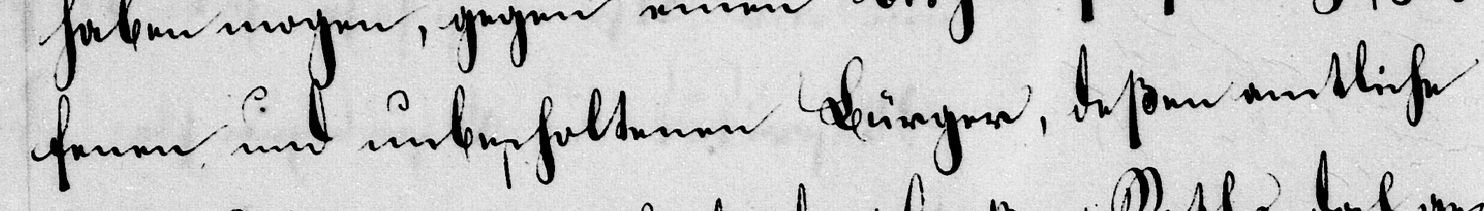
fenen und unbescholtenen Bürger, deßen amtliche
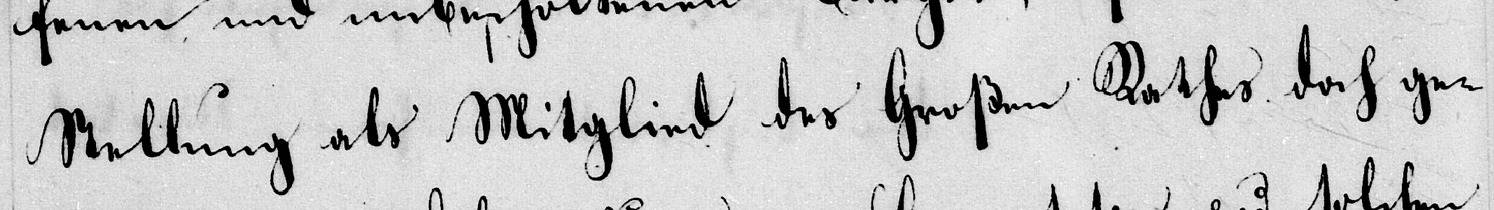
Stellung als Mitglied des Großen Rathes doch ge¬
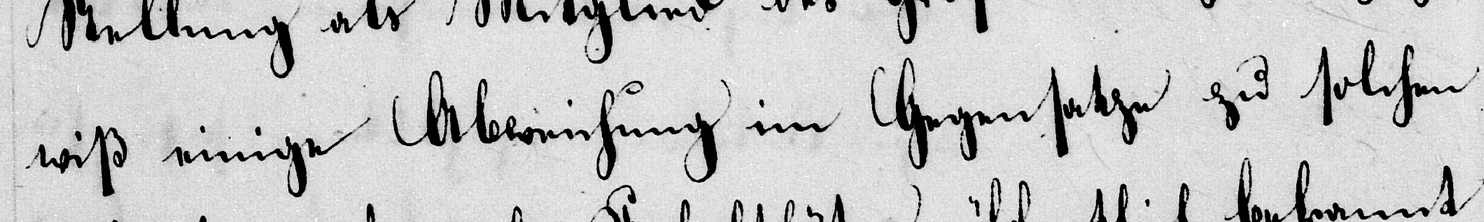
wiß einige Abweichung im Gegensatze zu solchen
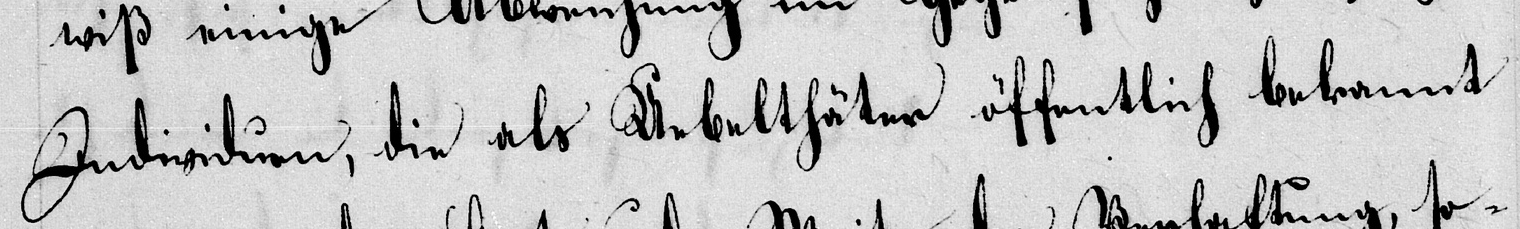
Individuen, die als Uebelthäter öffentlich bekannt
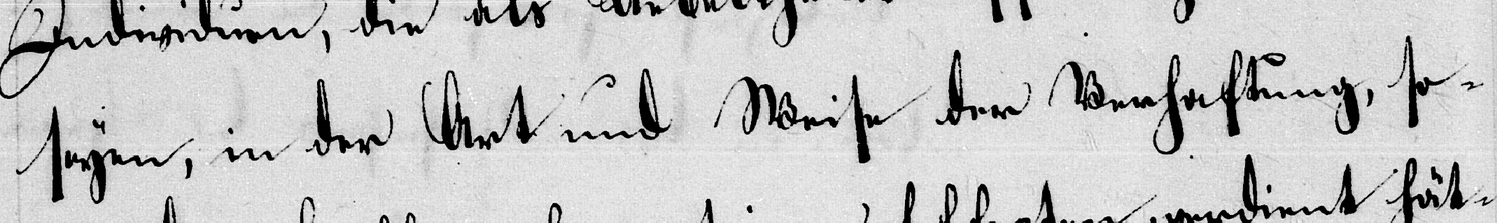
seyen, in der Art und Weise der Verhaftung, so¬
